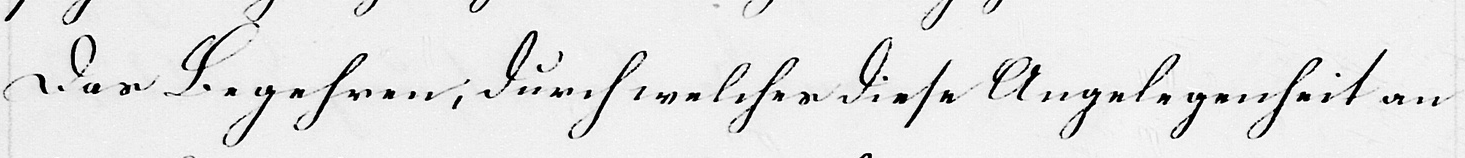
Das Begehren, durch welches diese Angelegenheit an
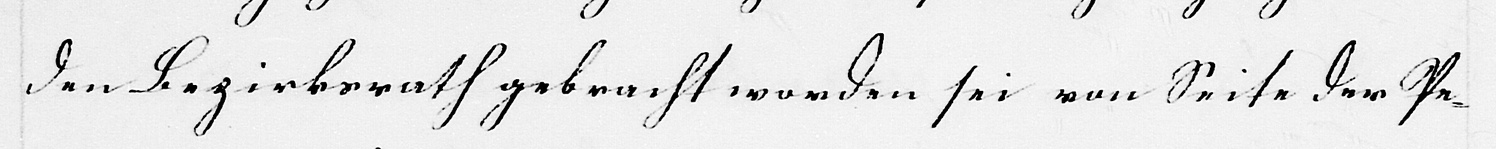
den Bezirksrath gebracht worden sei von Seite der Pe¬
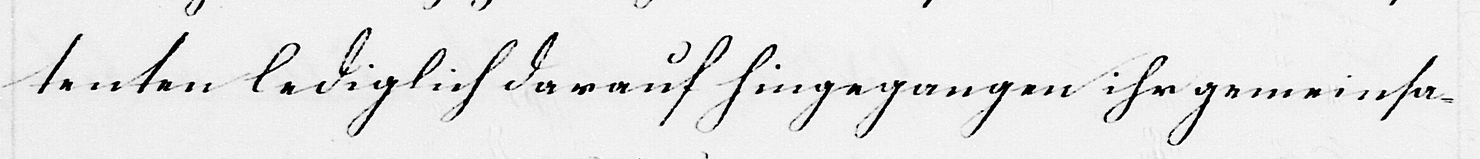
tenten lediglich darauf hingegangen ihr gemeinsa¬
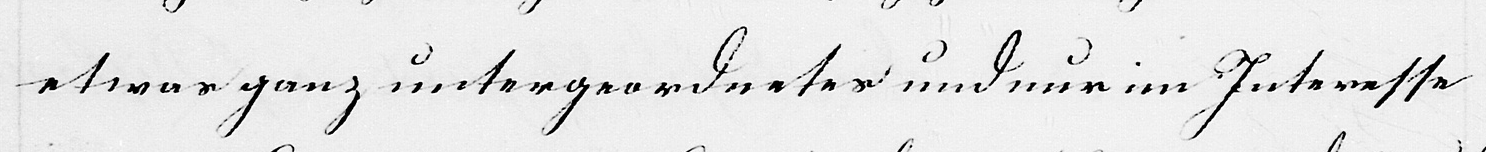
etwas ganz untergeordnetes und nur im Interesse
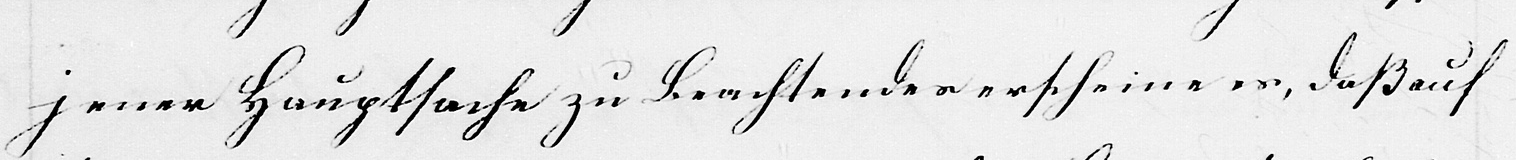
jener Hauptsache zu Beachtendes erscheine es, daß auf
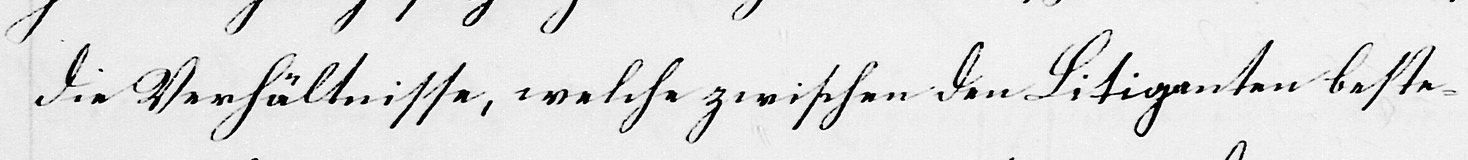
die Verhältnisse, welche zwischen den Litiganten beste¬
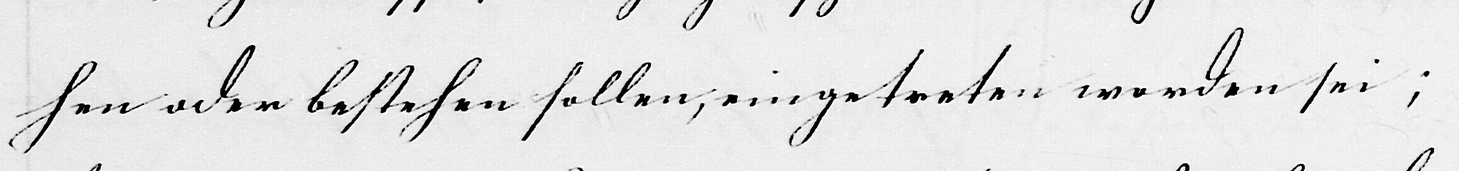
hen oder bestehen sollen, eingetreten worden sei;
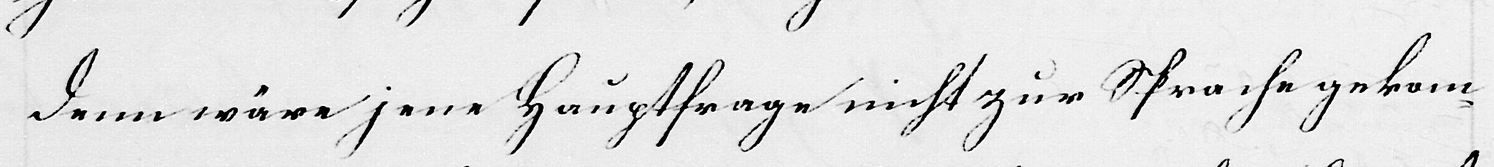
denn wäre jene Hauptfrage nicht zur Sprache gekom¬
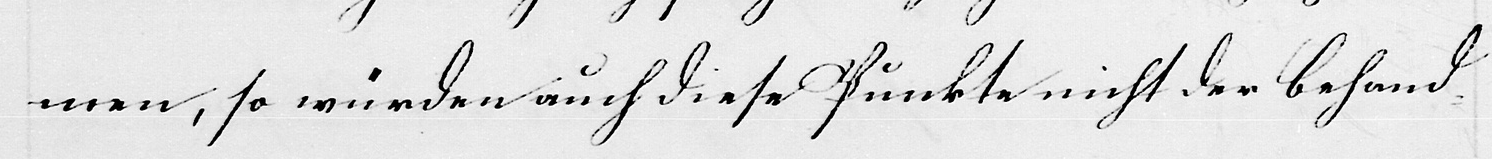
men, so würden auch diese Punkte nicht der Behand¬
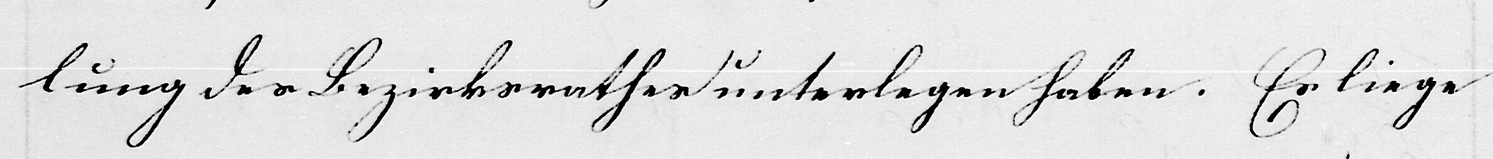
lung des Bezirksrathes unterlegen haben. Es liege
